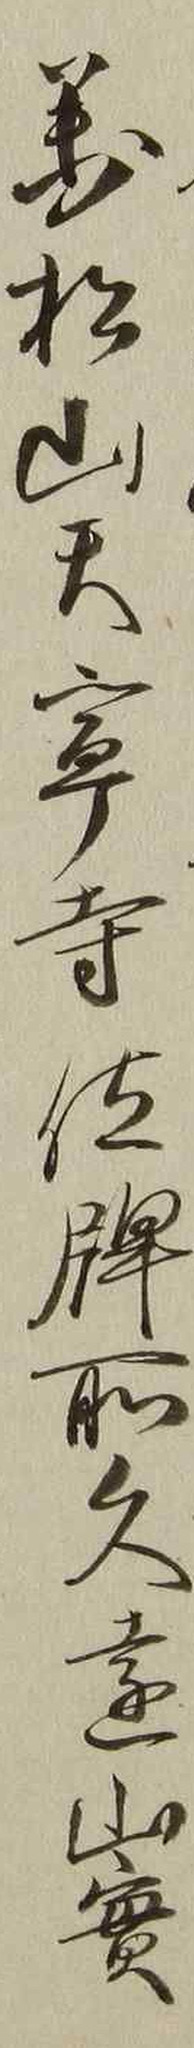万松山天寧寺位脾所久遠山実
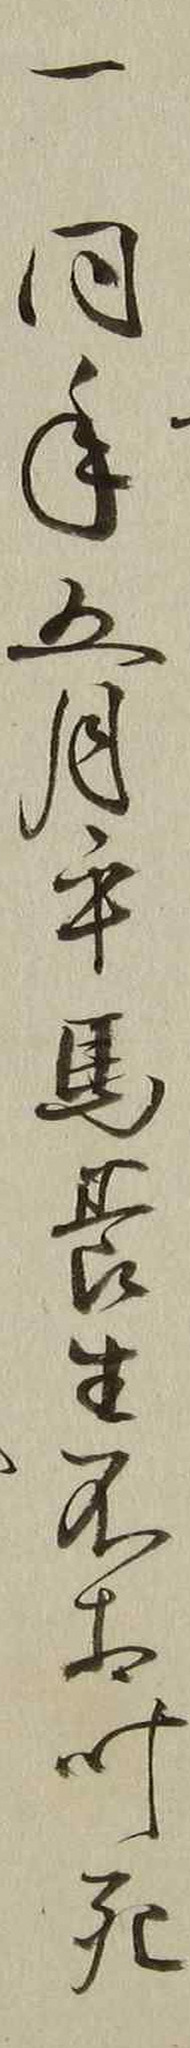一同年五月平馬養生不相叶死
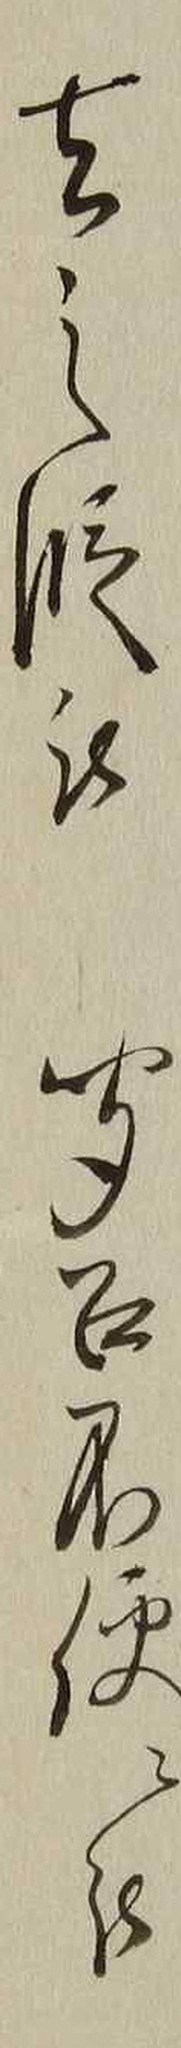去之段被聞召不便に被
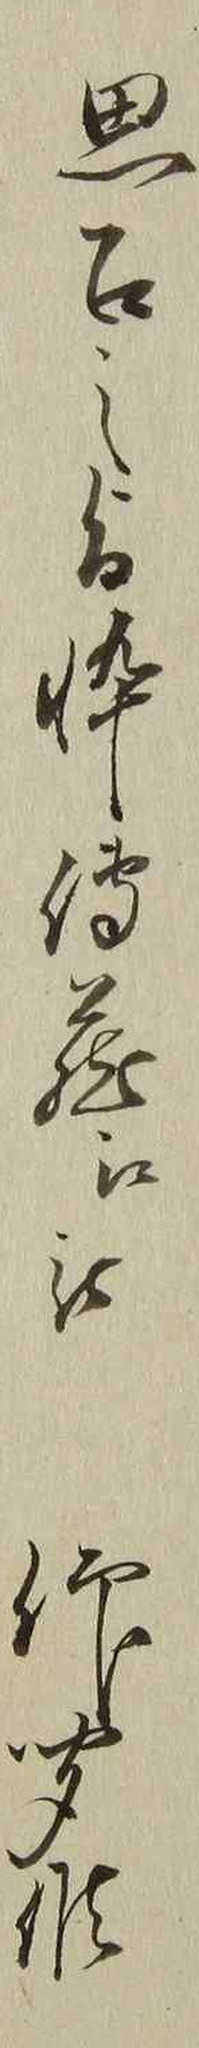思召之旨忰伝蔵江被仰聞候
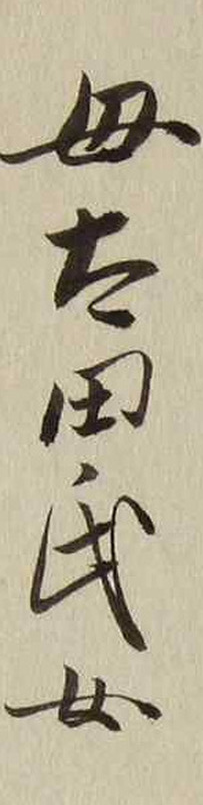母太田氏女
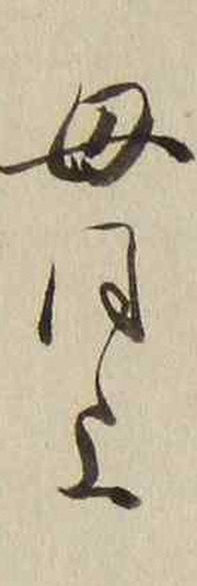母同上

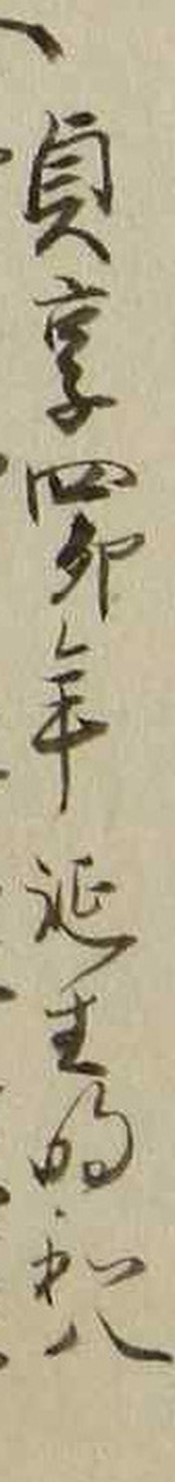貞享四卯年誕生明和八
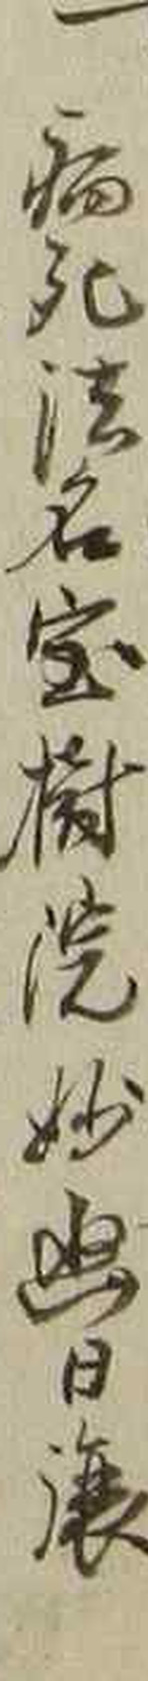死法名宝樹院妙画日張
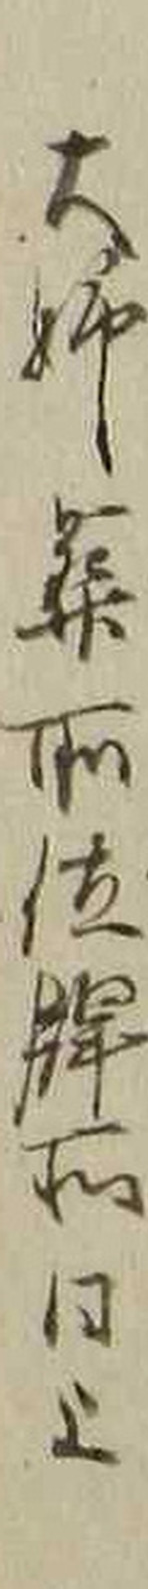大姉葬所位牌所同上
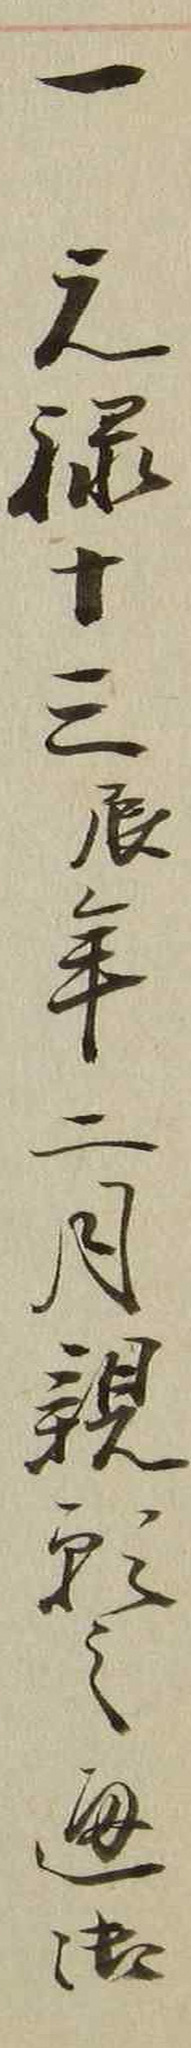一元禄十三辰年二月親願之通御
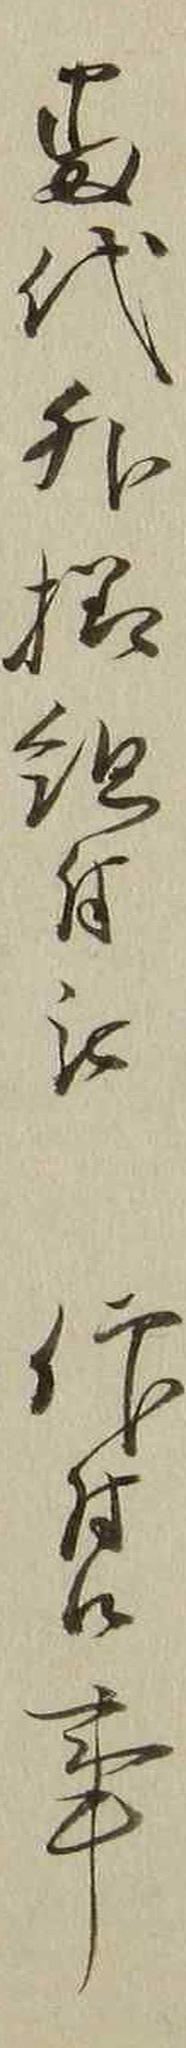番代外様組付被仰付候事
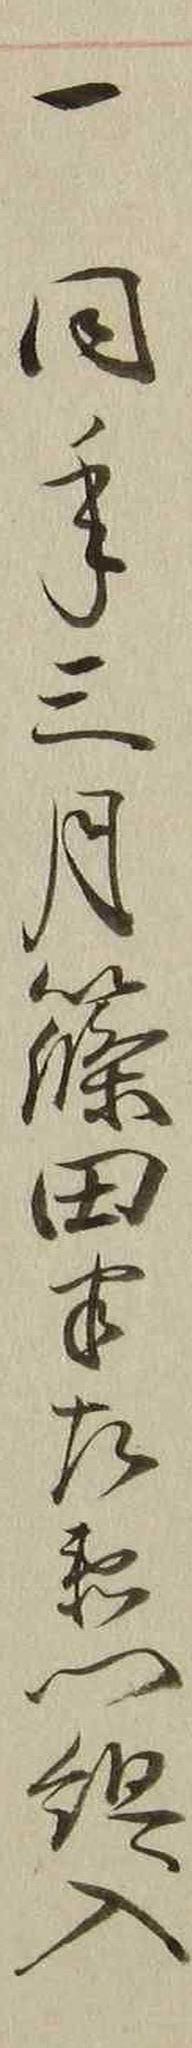一同年三月篠田半左衛門組へ入
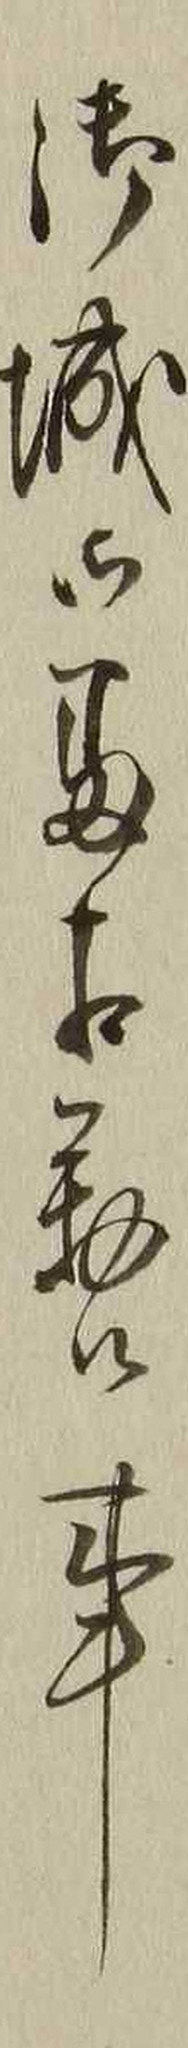御城御番相勤候事
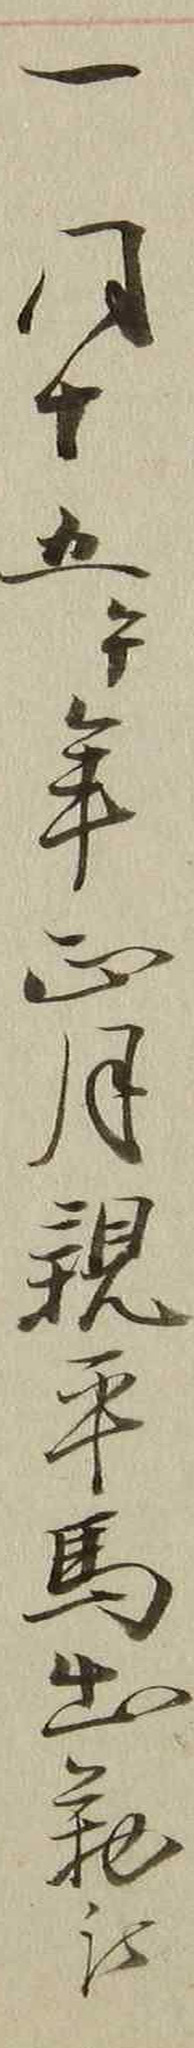一同十五午年正月親平馬出勤被
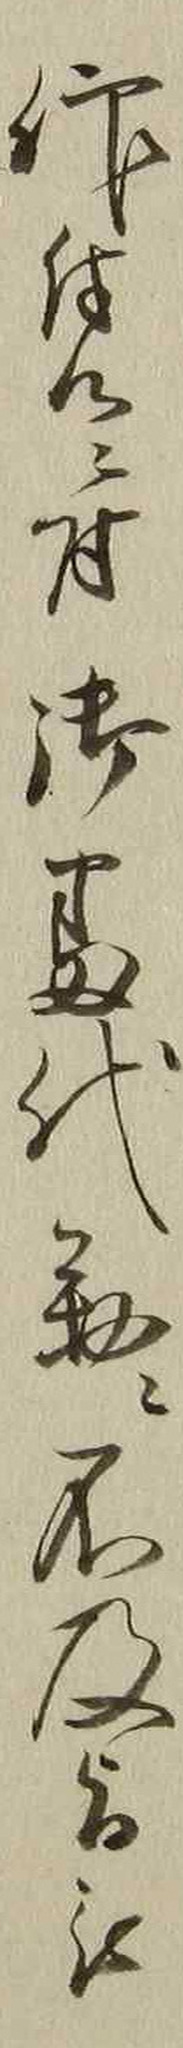仰付候に付御番代勤に不及旨被
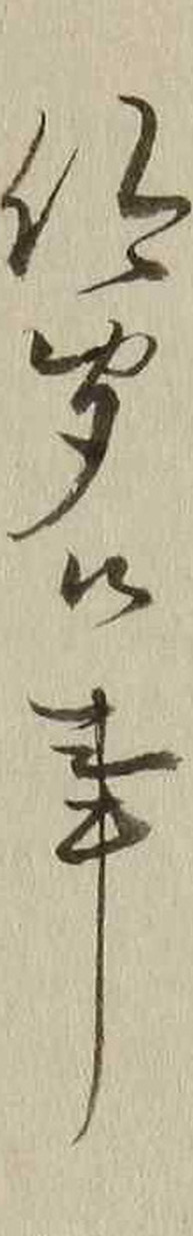仰聞候事
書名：諸士系譜　巻之103　か之部11
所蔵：会津若松市立会津図書館
